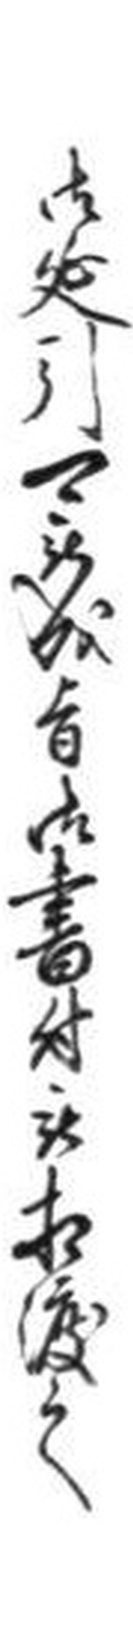御延引可被成旨御書付被相渡之
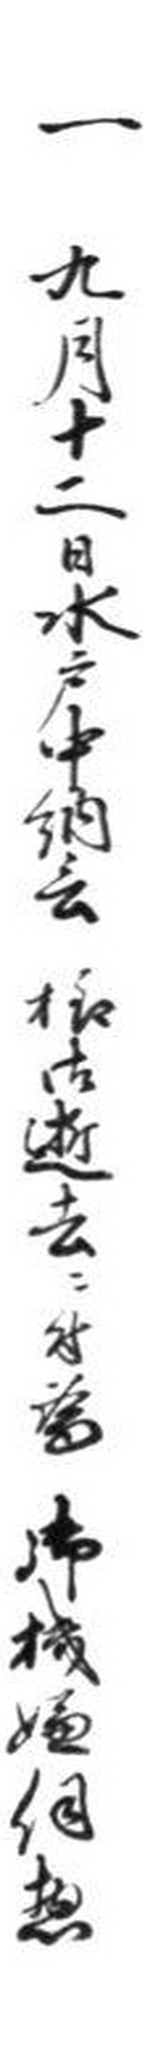一九月十二日水戸中納言様御逝去ニ付為御機嫌伺惣
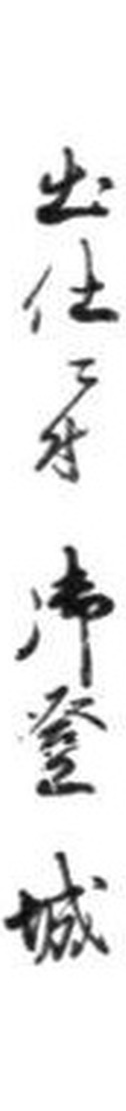出仕ニ付御登城
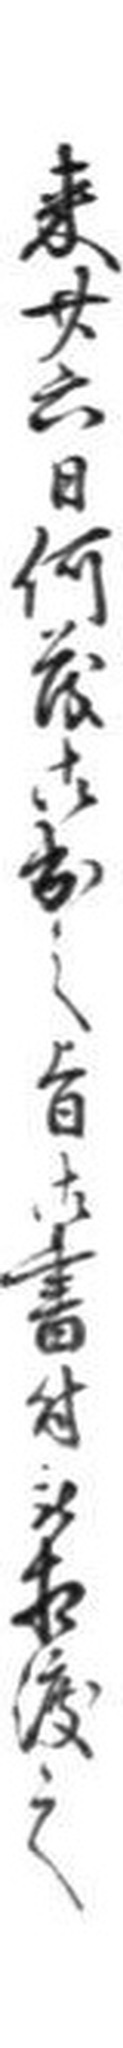来廿六日何茂御出之旨御書付被相渡之
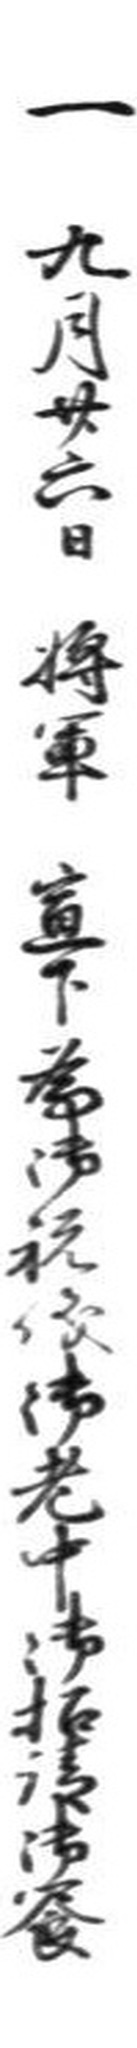一九月廿六日将軍宣下為御祝儀御老中御招請御饗
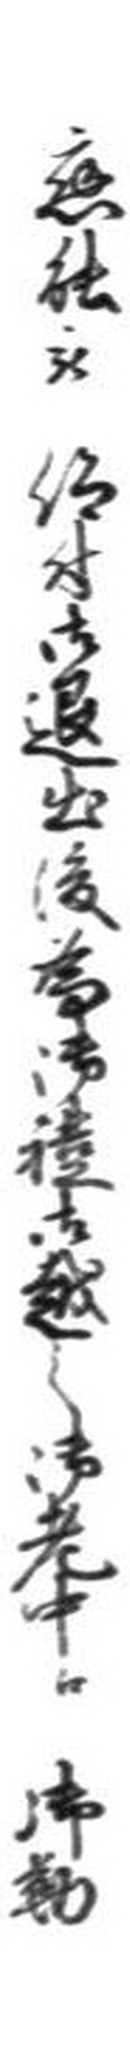応能被仰付御退出後為御礼御越之御老中江御勤
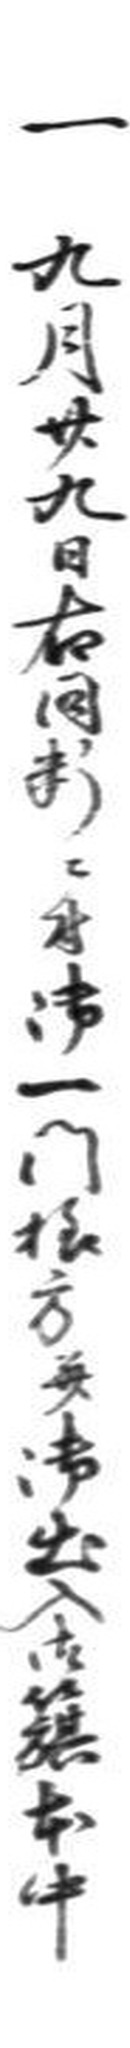一九月廿九日右同断ニ付御一門様方并御出入御旗本中
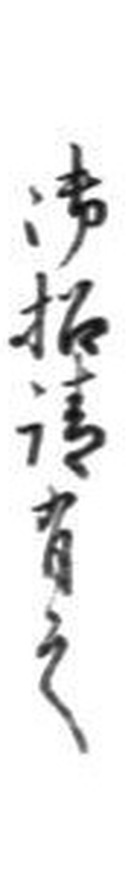御招請有之
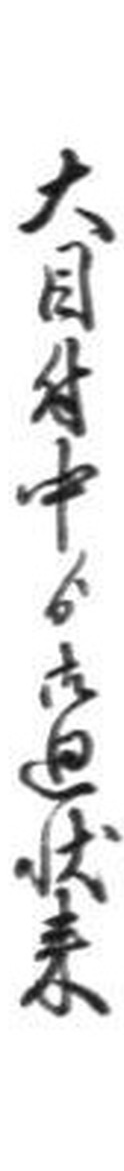大目付中ゟ御廻状来
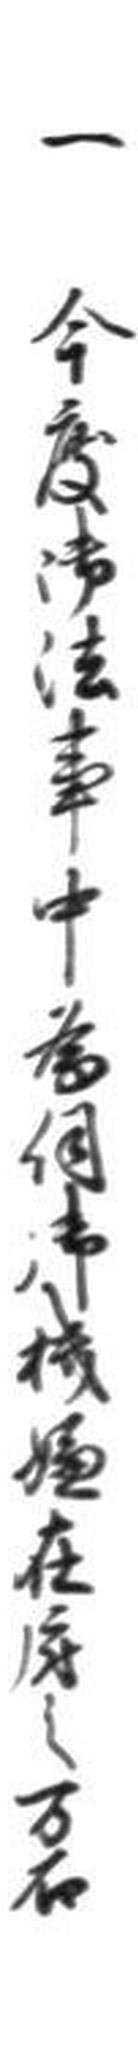一今度御法事中為伺御機嫌在府之万石
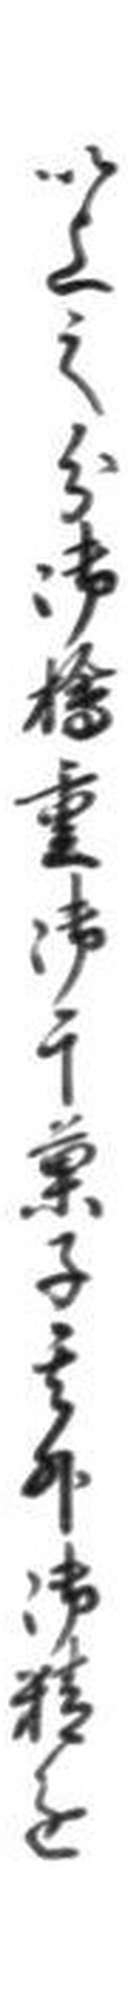以上之分御檜重御干菓其外御精進

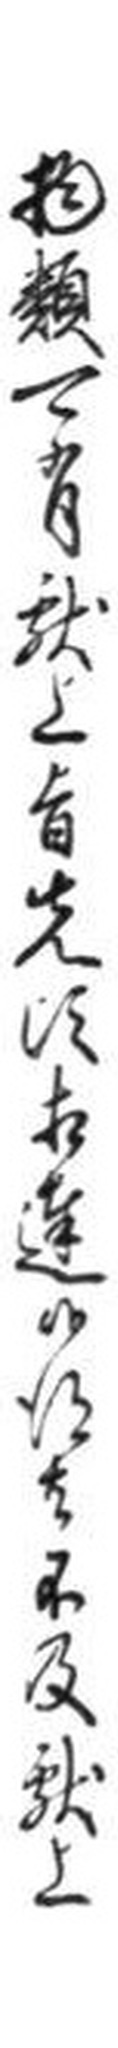物類可有献上旨先頃相達候得共不及献上
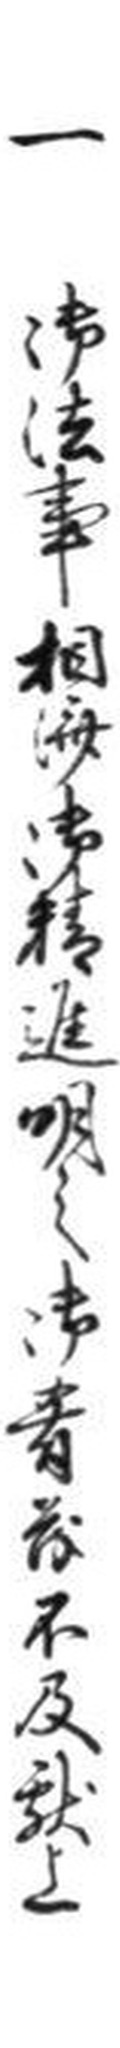一御法事相済御精進明之御肴茂不及献上
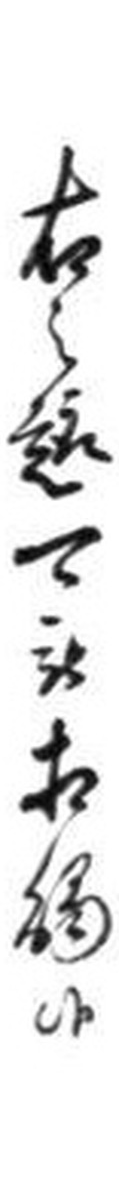右之趣可被相触候
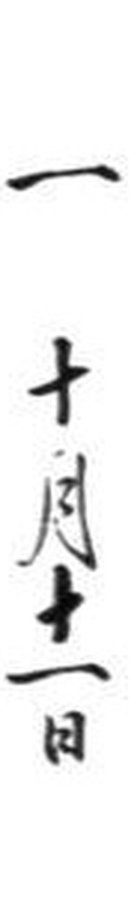一十月十一日
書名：家譜 三十二 吉邦公 従享保二年到享保三年
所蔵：福井県文書館 Fukui Prefectural Archives
